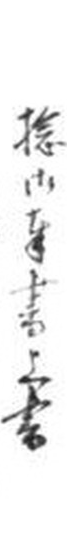捻御奉書上書
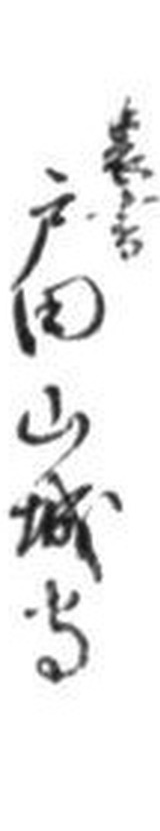戸田山城守
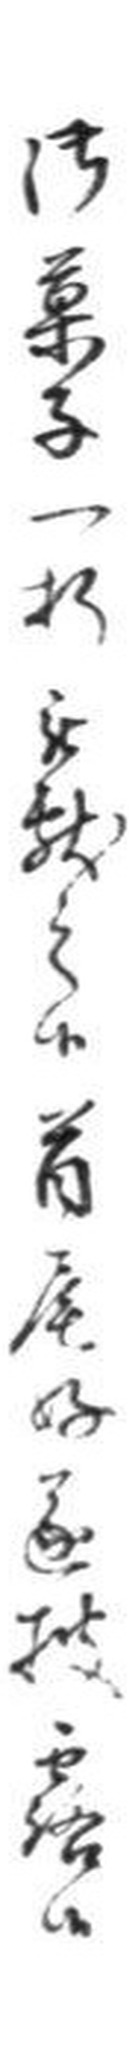御菓子一折被献之候首尾好遂披露候
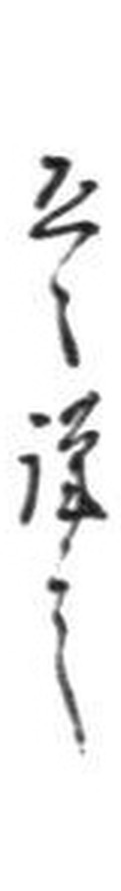恐々謹言
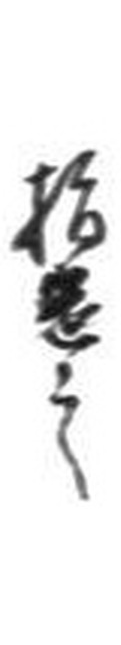指遣之
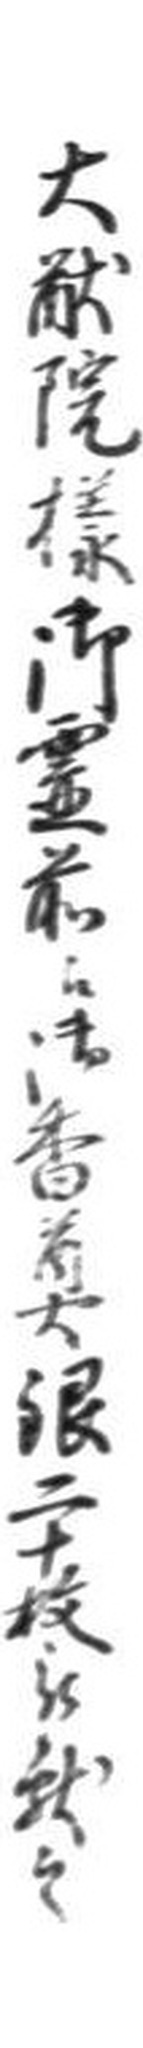大猷院様御霊前江御香奠銀三十枚被献之
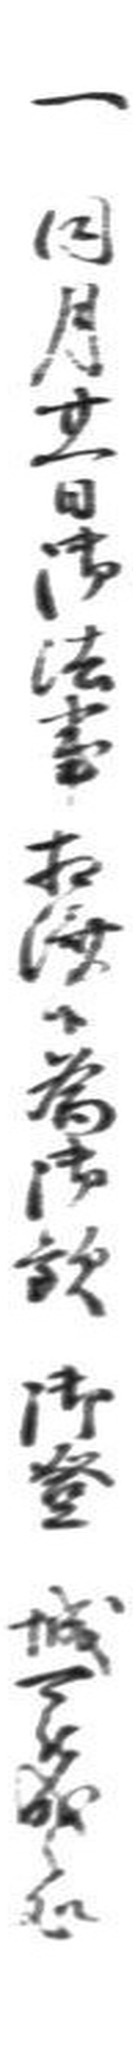一同月廿一日御法事相済候為御歓御登城可被成之処
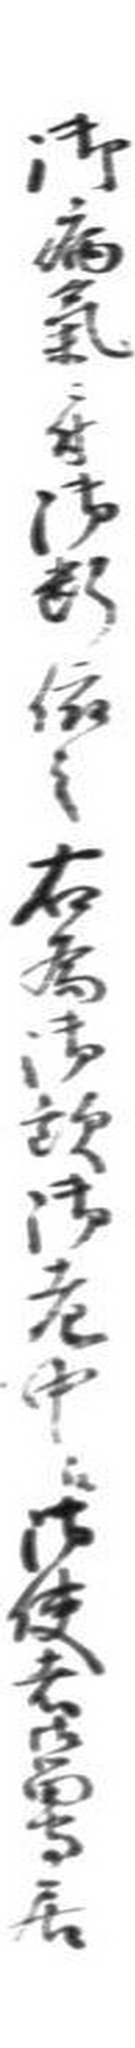御病気ニ付御断依之右為御歓御老中江御使者御留守居
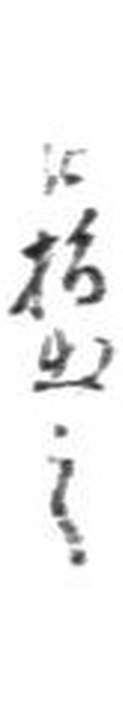被指出之

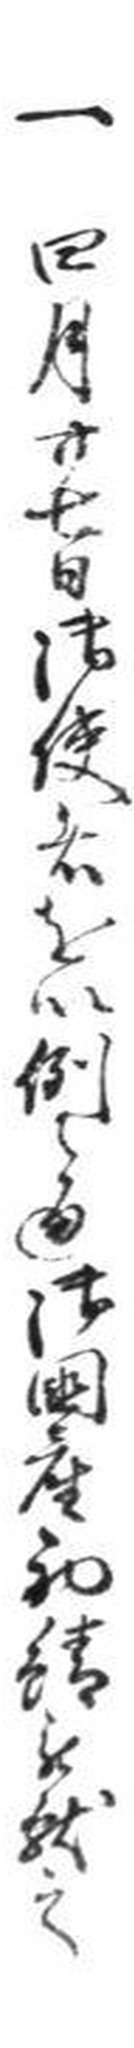一四月廿七日御使者を以例之通御国産初鯖被献之
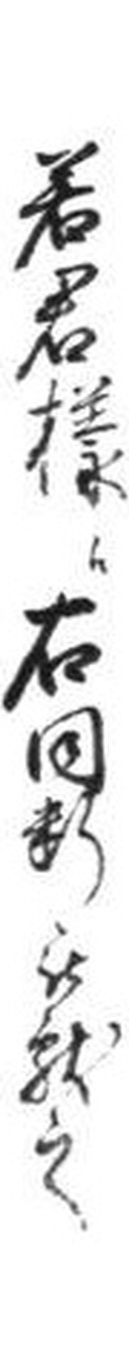若君様江右同断被献之
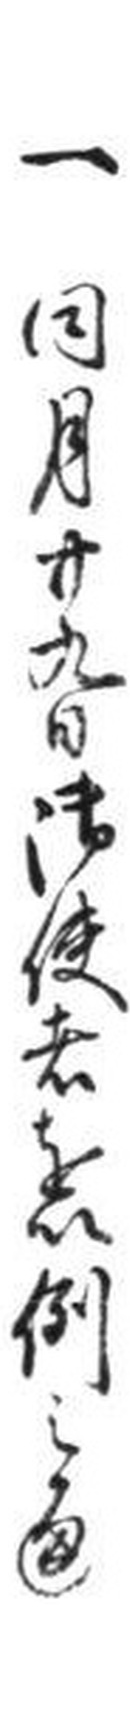一同月廿九日御使者を以例之通
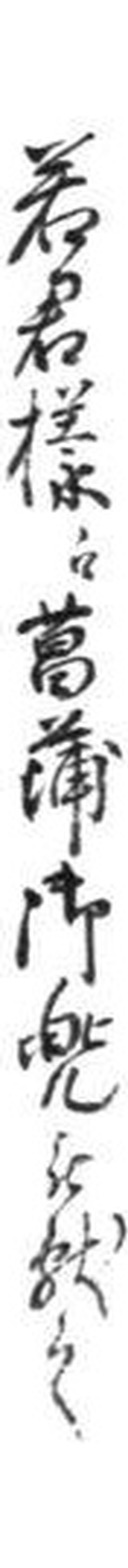若君様江菖蒲御兜被献之
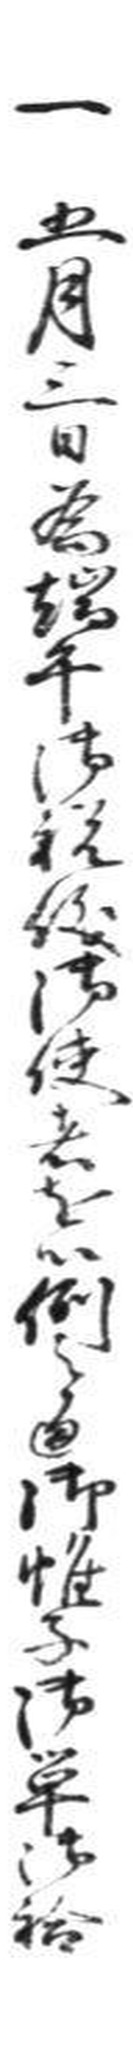一五月三日為端午御祝儀御使者を以例之通御帷子御単御袷
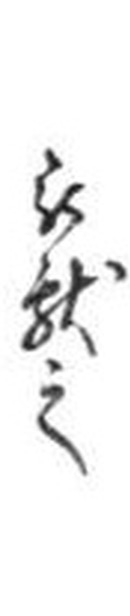被献之
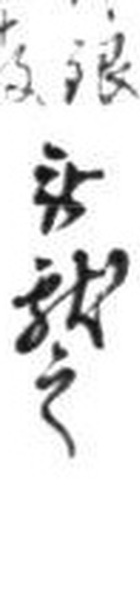被献之
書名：家譜 十五 綱昌公 従天和元年到元禄十二年
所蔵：福井県文書館 Fukui Prefectural Archives
